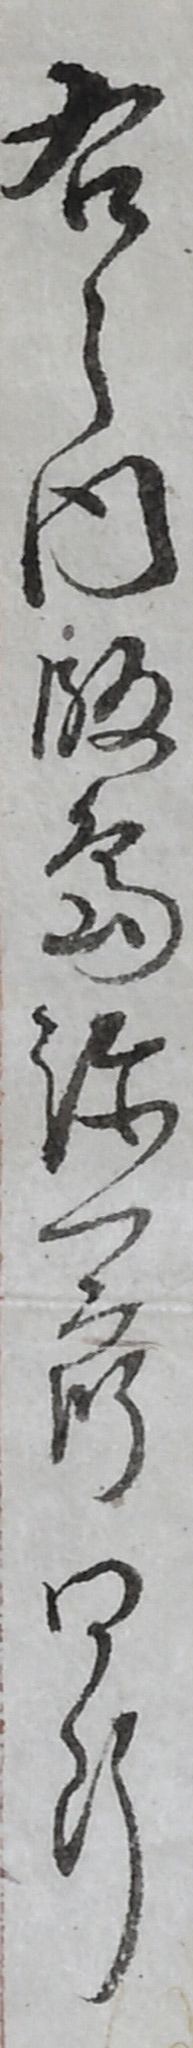右之内飯島弥一郎同断
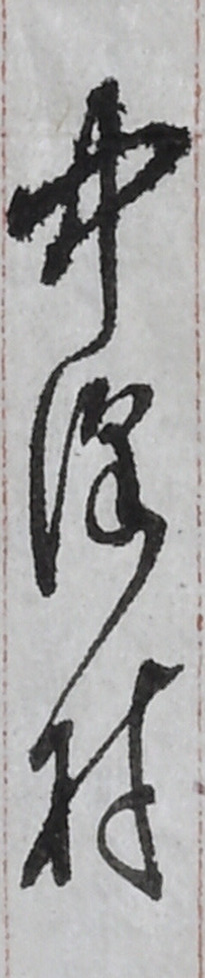中澤村
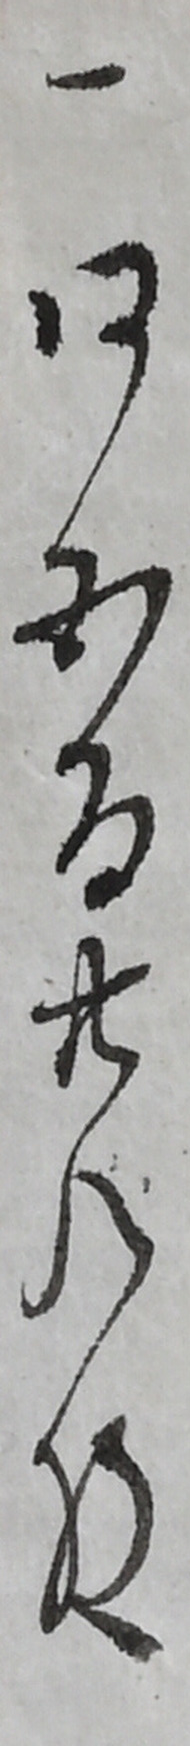一同五百廿八枚
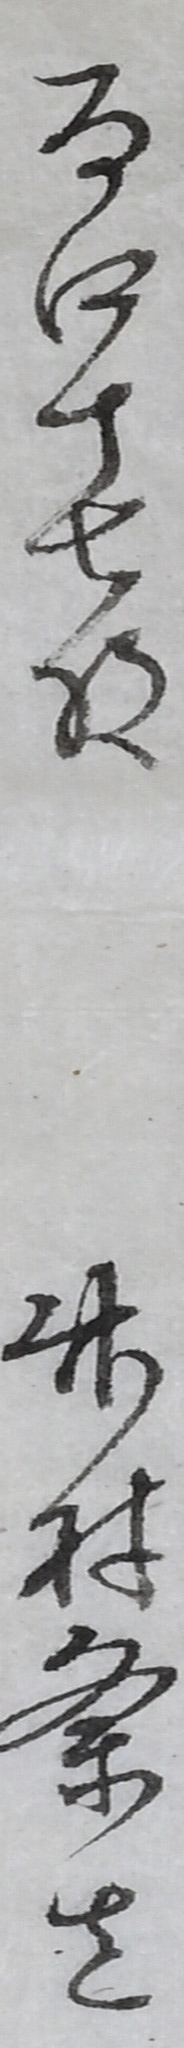百四十七枚竹林条造
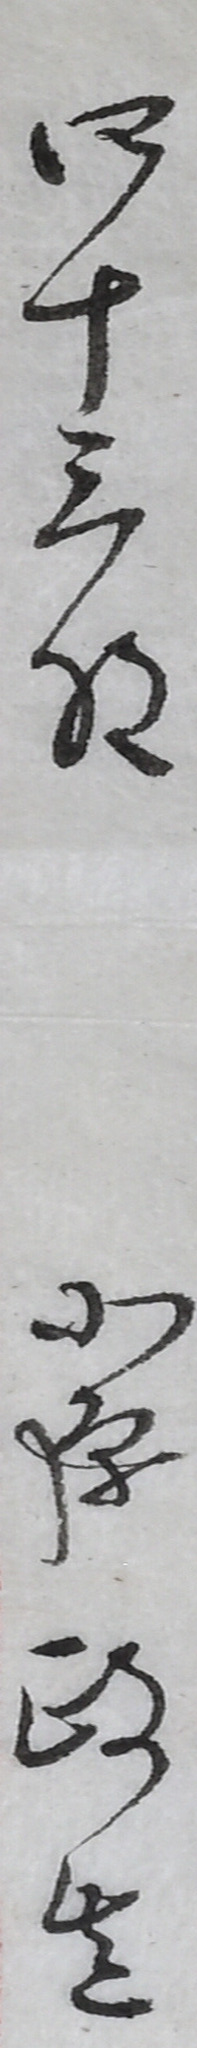四十三枚北原政造
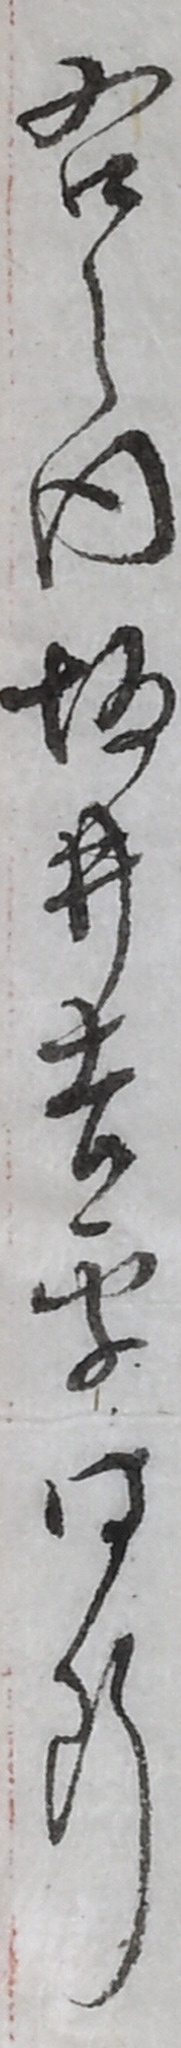右之内坂井吉平同断
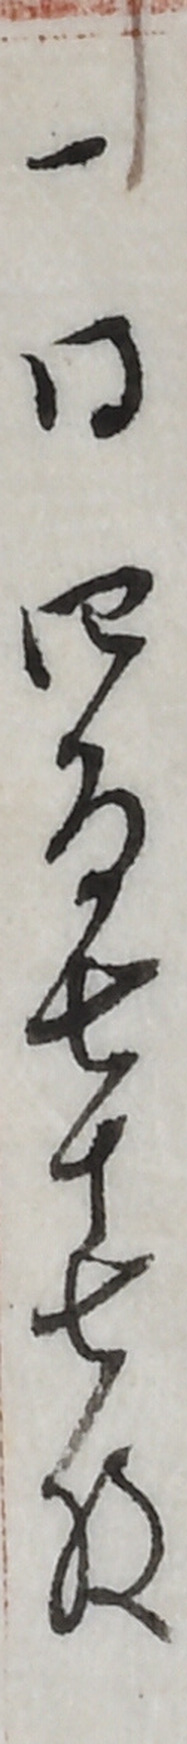一同四百七十七枚
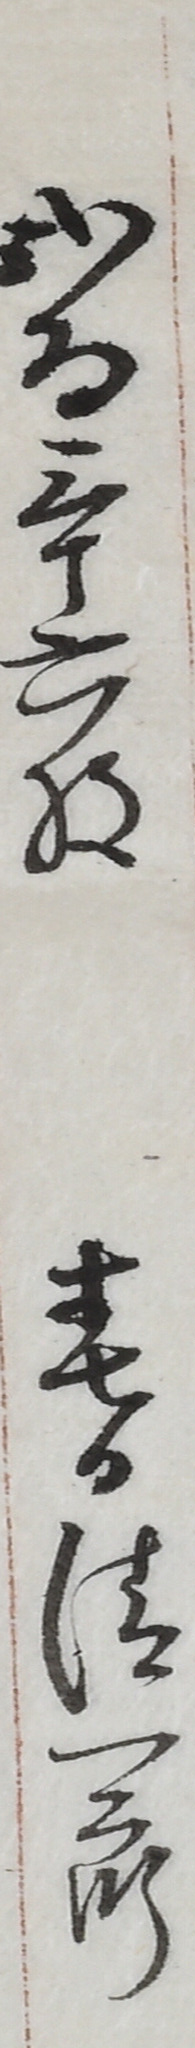弐百三十六枚春日日清一郎
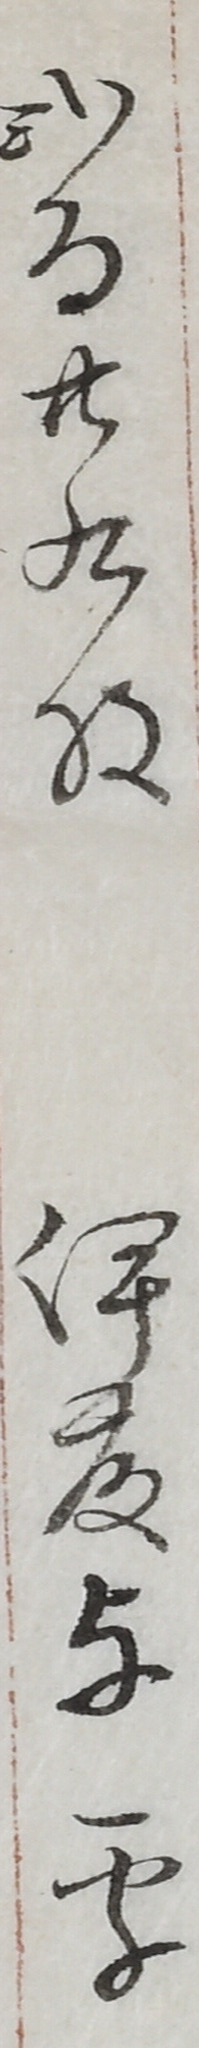弐百廿九枚伊藤与平
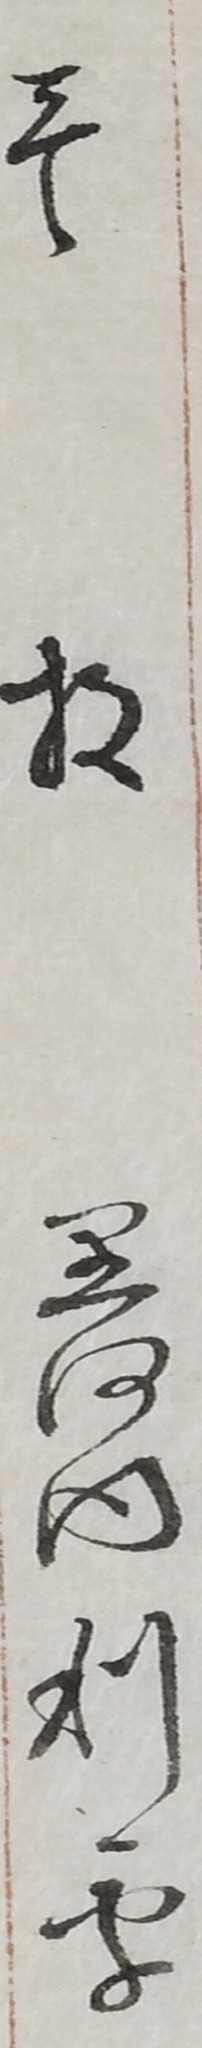壱枚黒河内利平
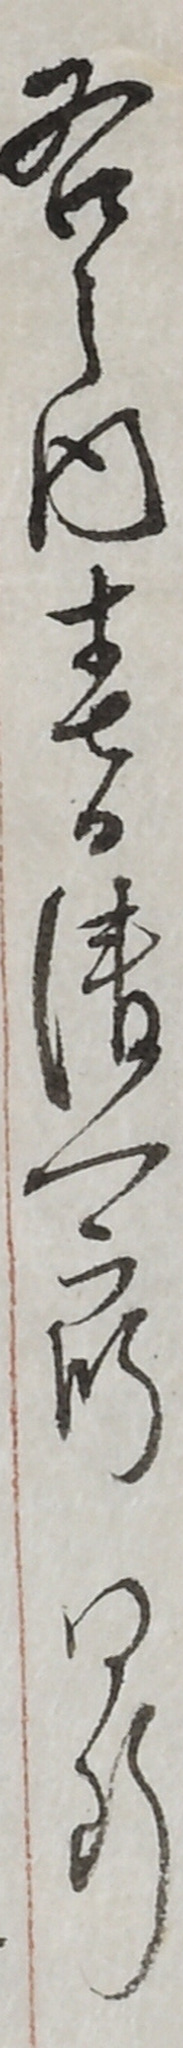右之内春日清一郎同断
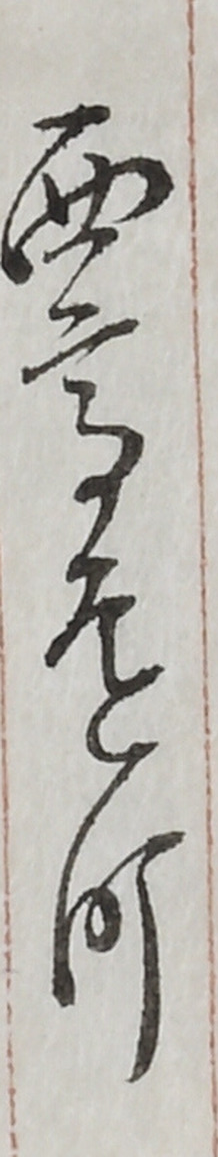西高遠町
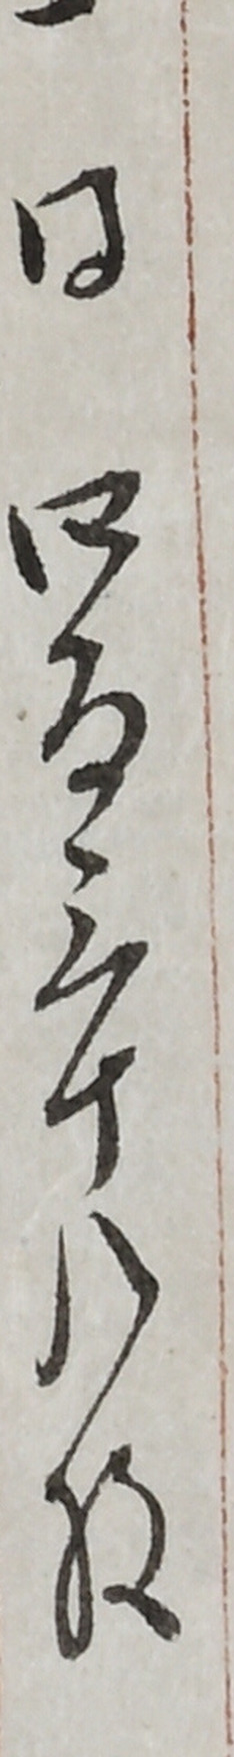一同四百三十八枚
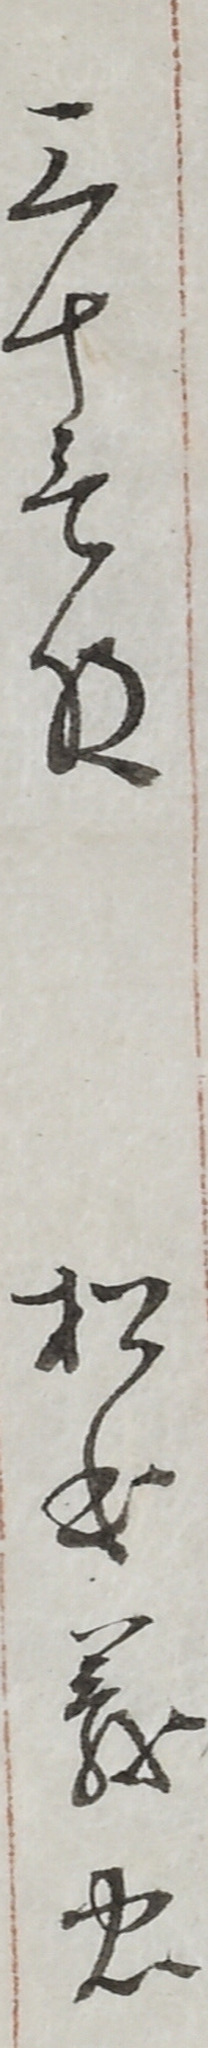三十壱枚松本義忠
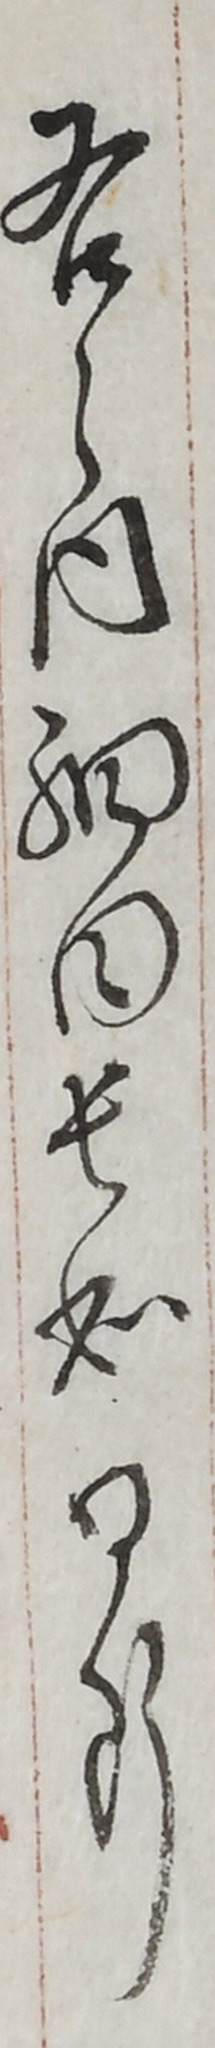右之内細田長和同断

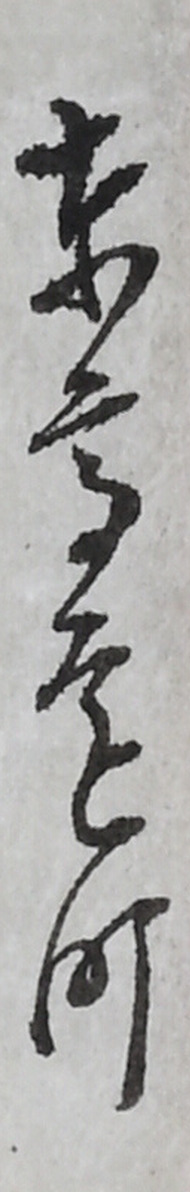東高遠町
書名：郡役所勤務中御用抜書
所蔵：伊那市立高遠町図書館・合同会社AMANE
